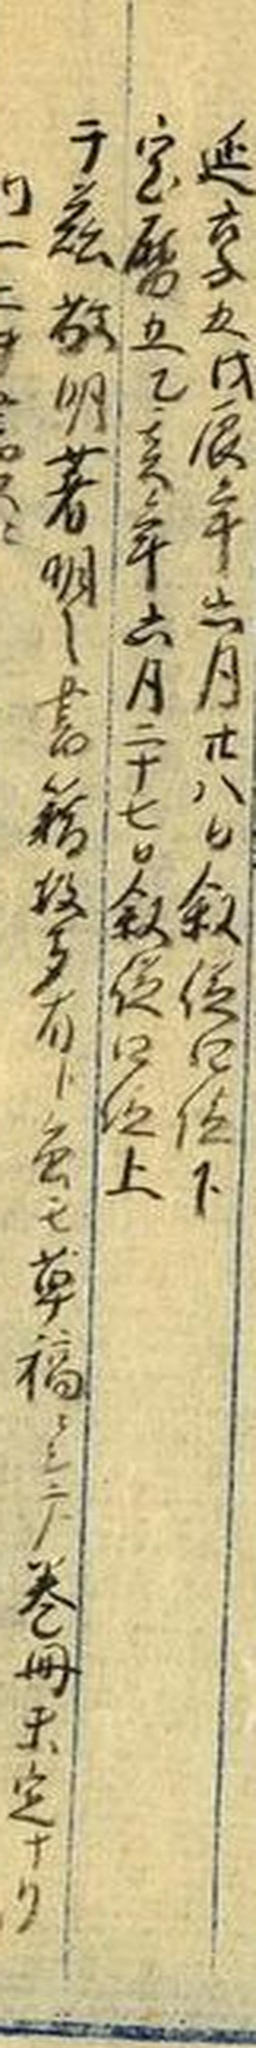于玆敬明著明之書藉数多有ト雖モ草稿ニシテ巻冊未定ナリ
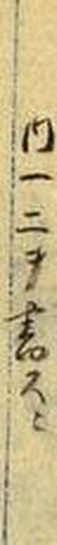内一二ヲ書ス也
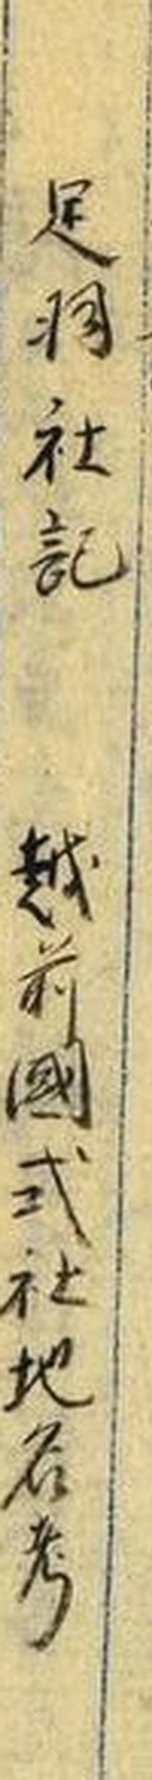足羽社記越前國式社地名考

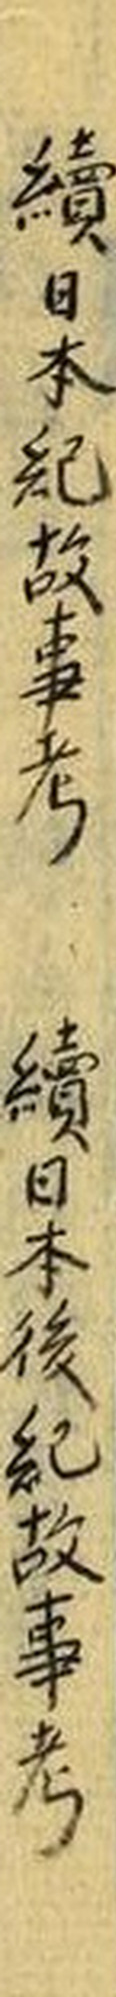續日本紀故事考續日本後紀故事考
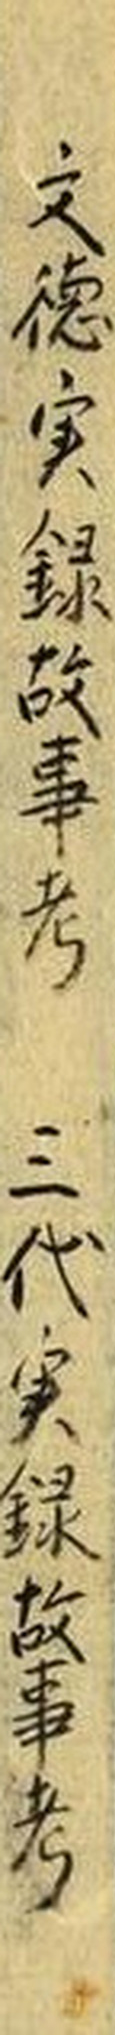文徳実録故事考三代実録故事考
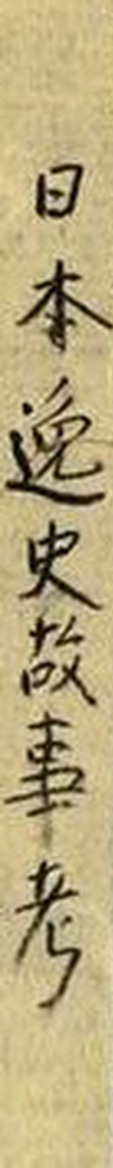日本逸史故事考
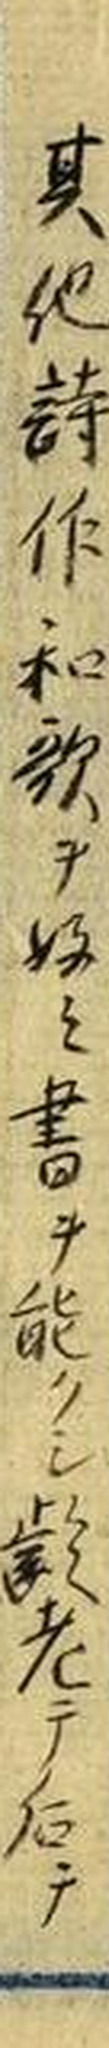其他詩作和歌ヲ好ミ書ヲ能クシ齢老テ后テ
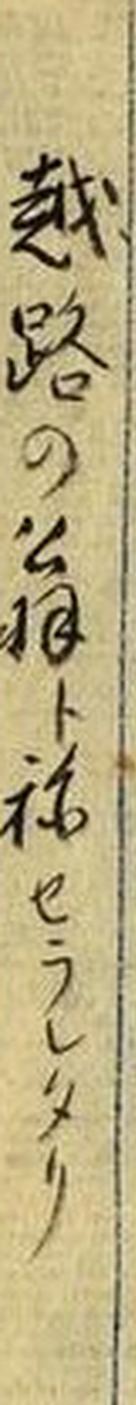越路の翁ト称セラレタリ
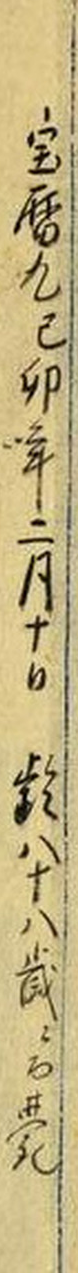宝暦九己卯年二月十日齢八十八歳ニ而薨
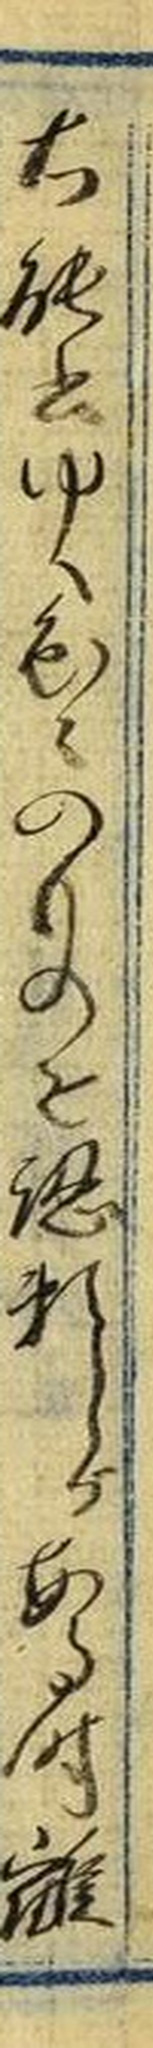右能書ゆへ色々のものを認頼しがある時鶴
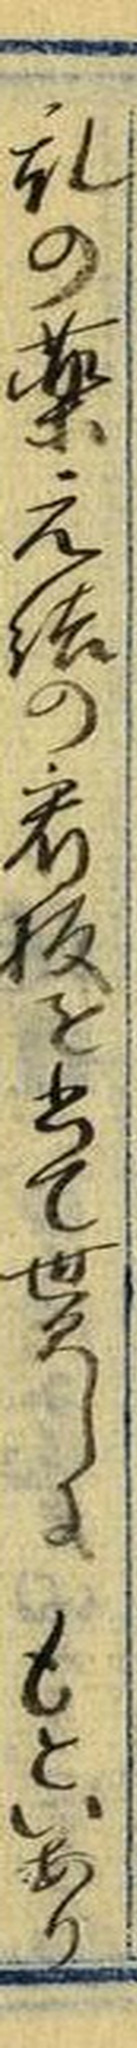乱の薬元結の看板を書て貰しにもといあり
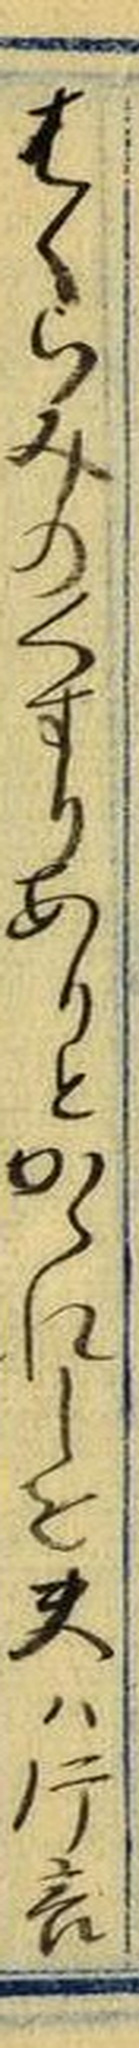はくらみのくすりありとかゝれしを夫は片音
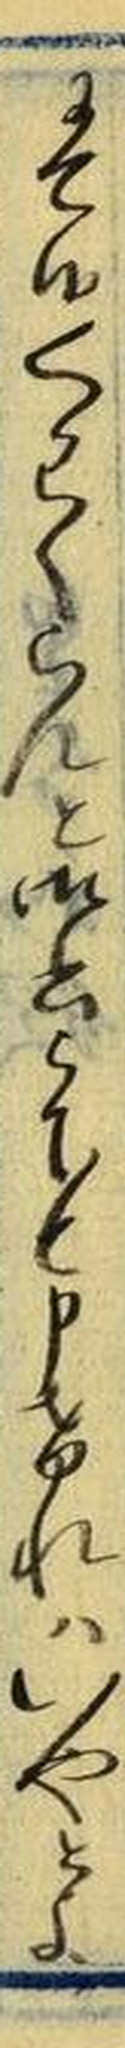にて候くわくらんと御書被下と申けれはいやとよ
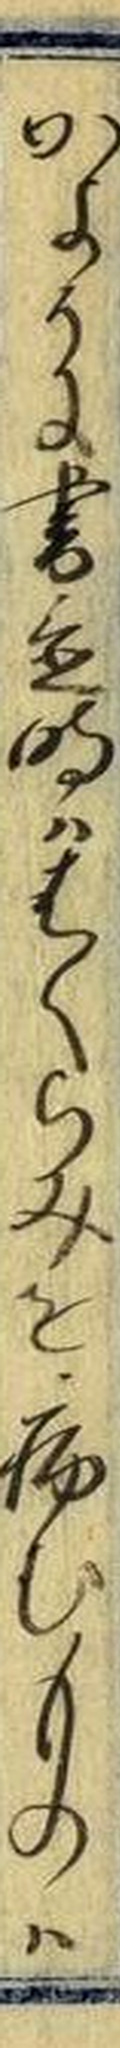かように書置時ははくらみを病むものは
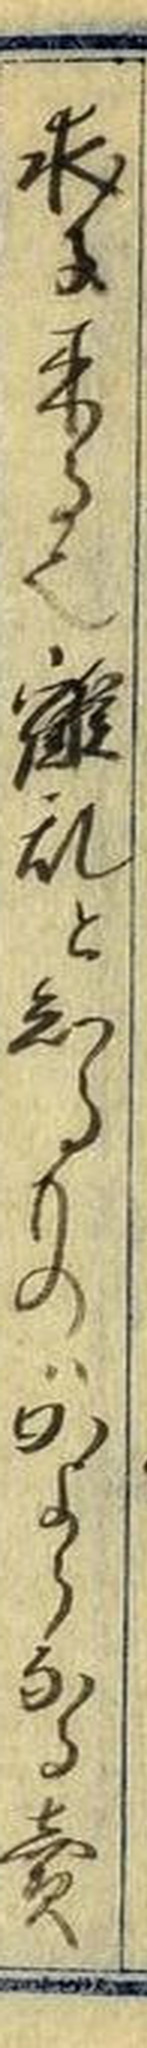求に来る也鶴乱と知るものはかようなる賣
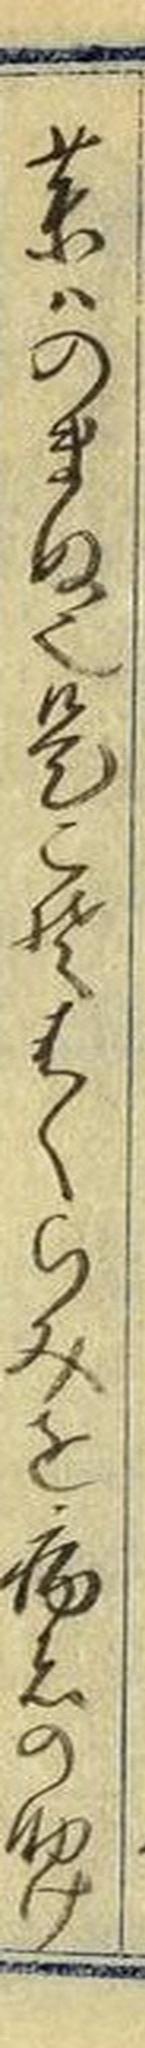薬はのまぬ也是こそはくらみを病者の助け
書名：温古集 三巻
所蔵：福井県文書館 Fukui Prefectural Archives
